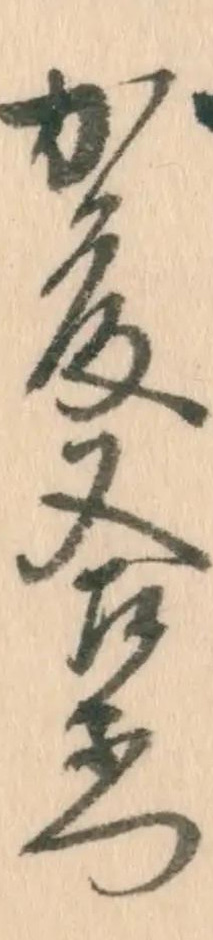加藤又左衛門
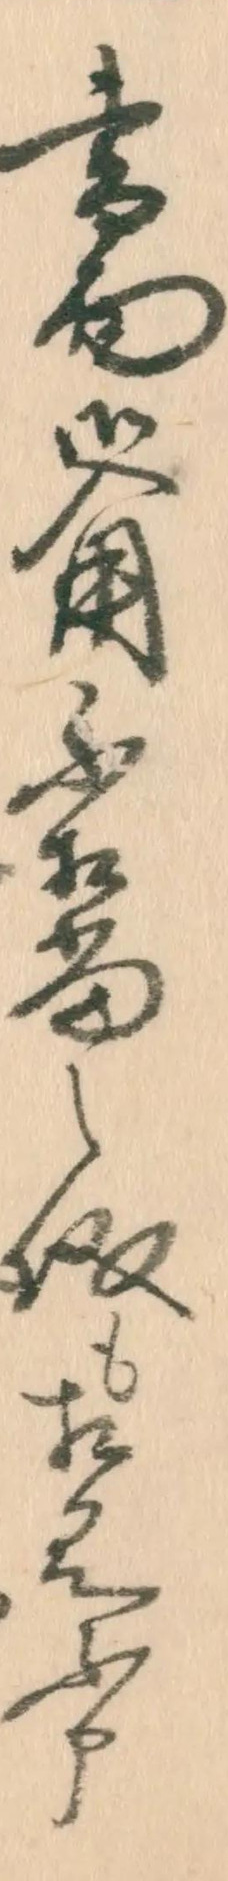書面御入用不相当之儀も相見不申
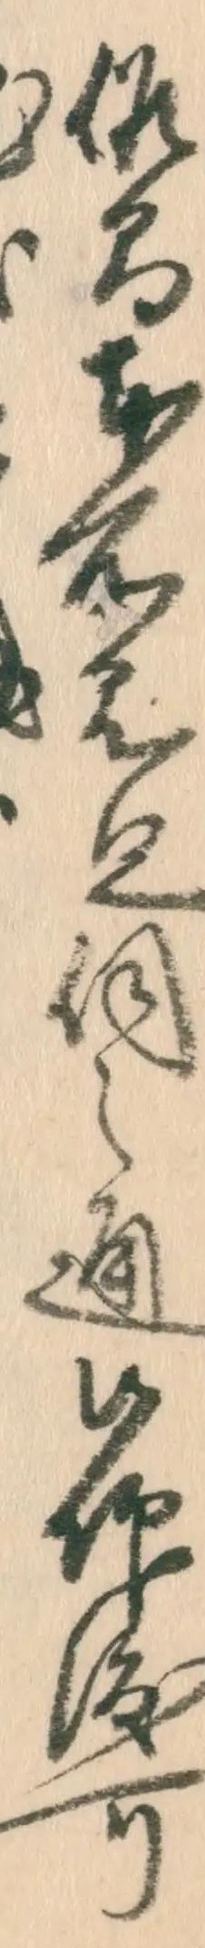候間本所見廻伺之通被仰渡可
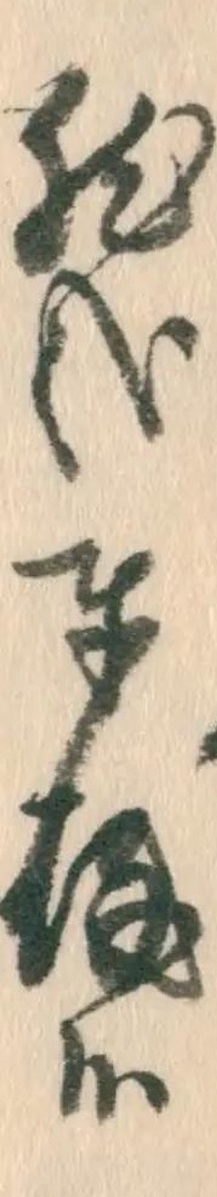然哉奉存候
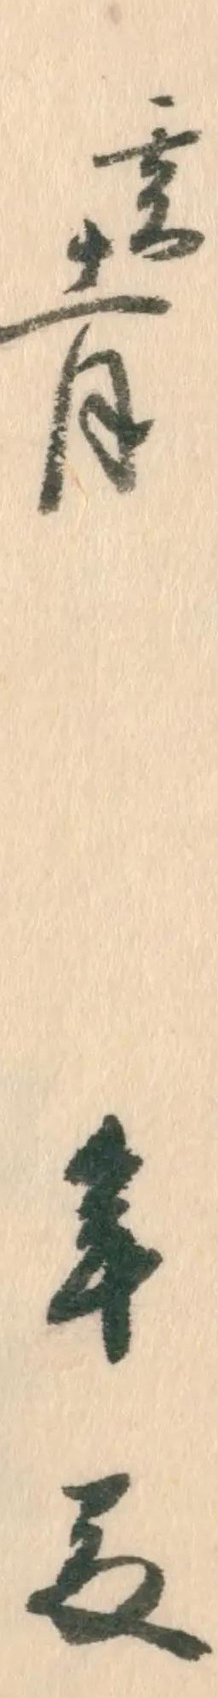亥十一月年番
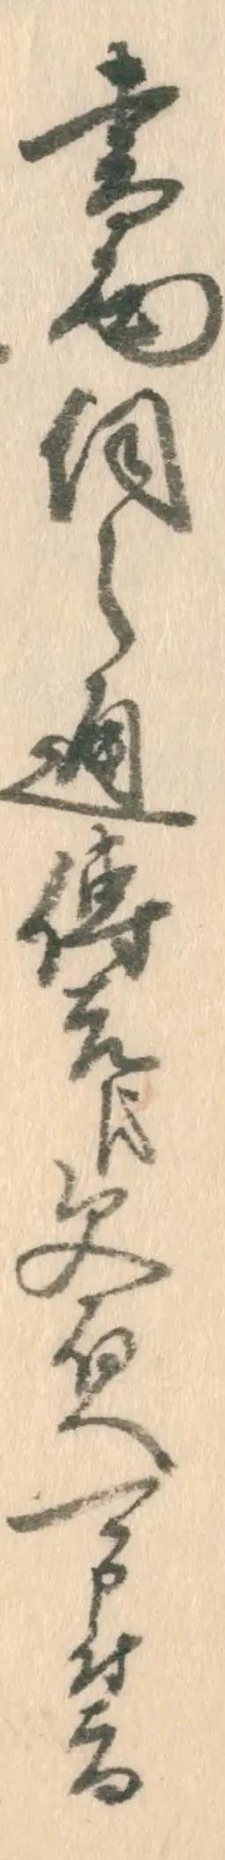書面伺之通伝吉え受負可申付旨
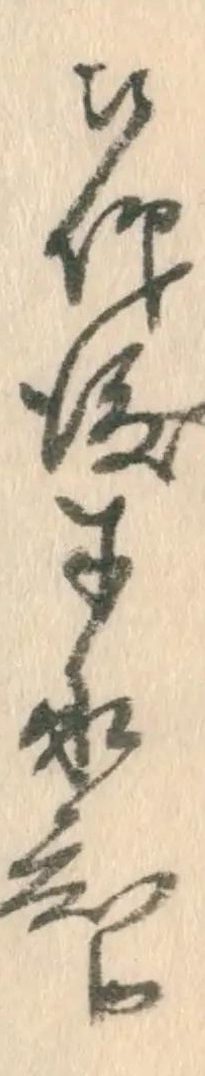被仰渡奉承知候

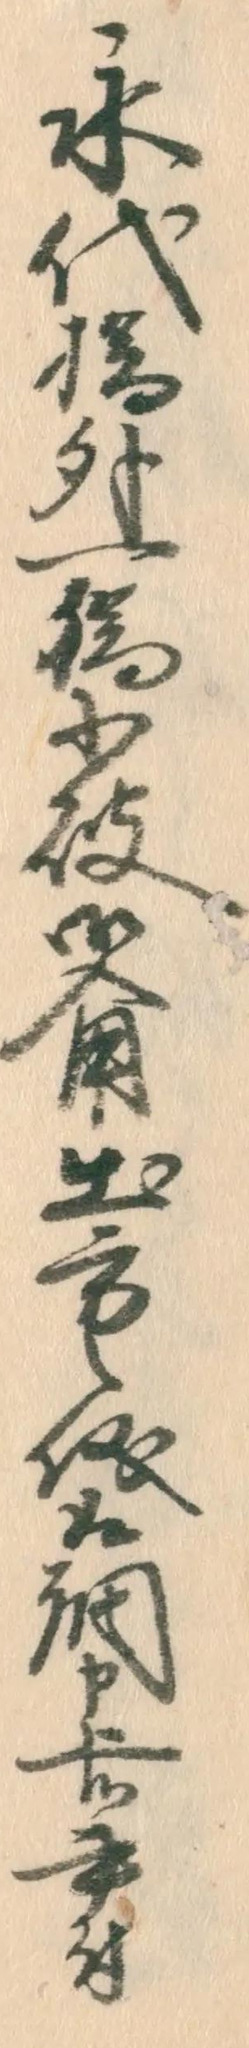永代橋外一橋小破御入用出方之儀取調申上候書付
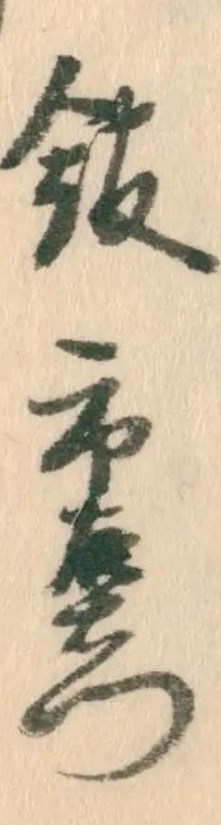館市右衛門
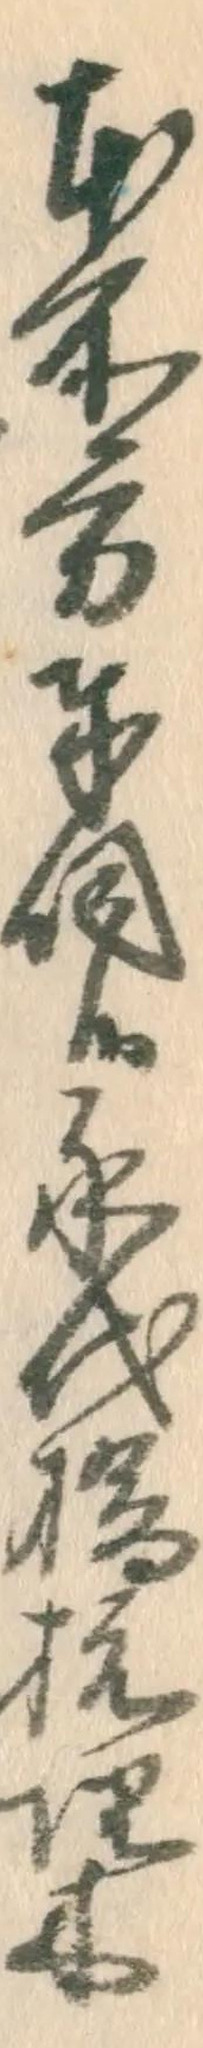本所方奉伺候永代橋杭埋木
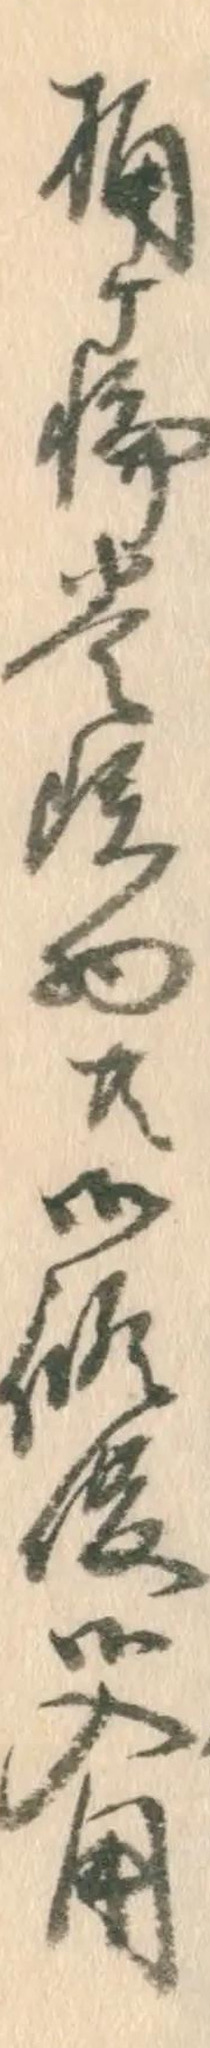桶ケ輪巻鉄物共御修復御入用
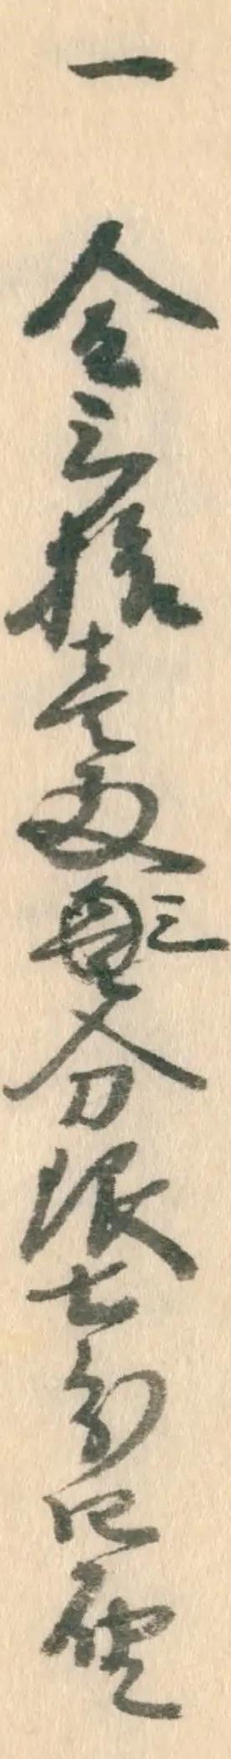一金三拾壱両三分銀七分四厘

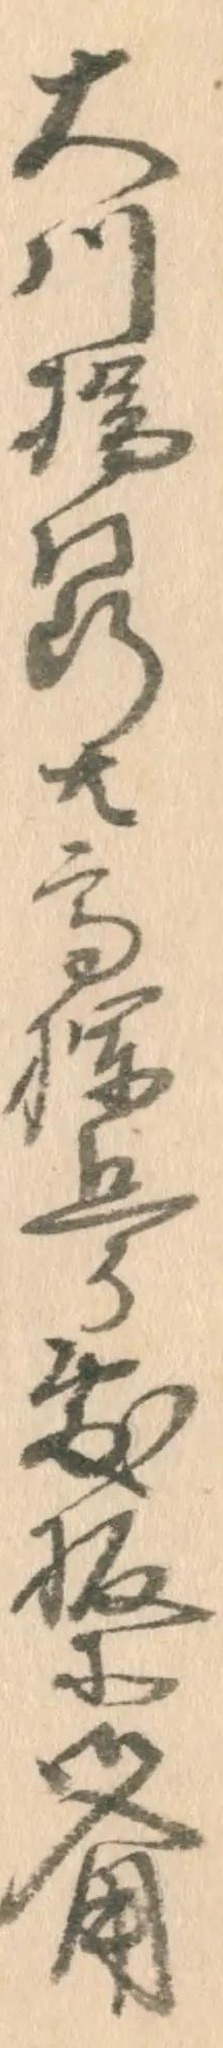大川橋同断共高欄廻り敷板等御入用
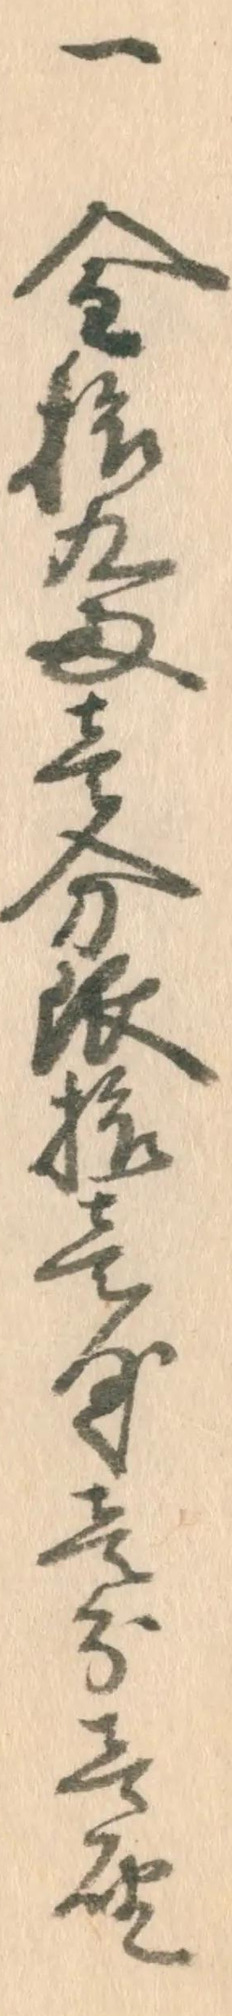一金拾九両壱分銀拾壱匁壱分壱厘
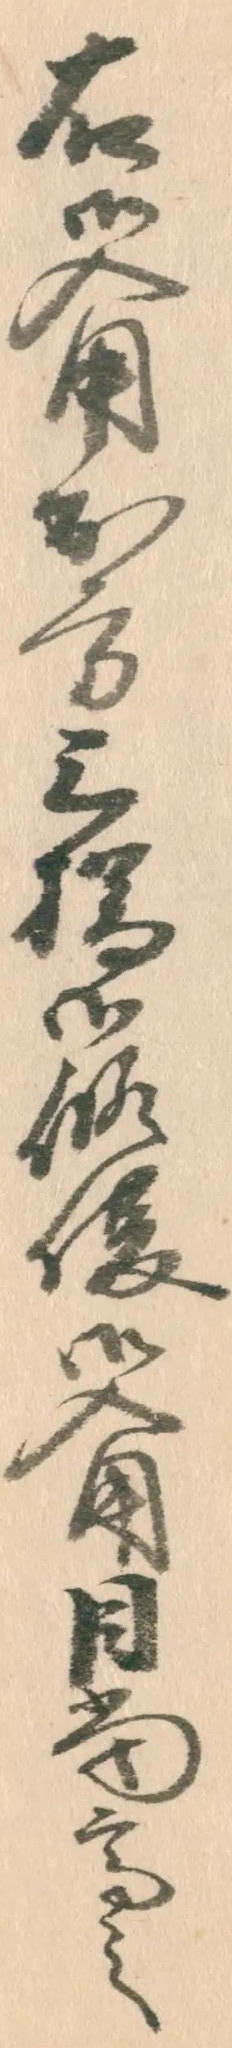右御入用出方三橋御修復御入用目当高之
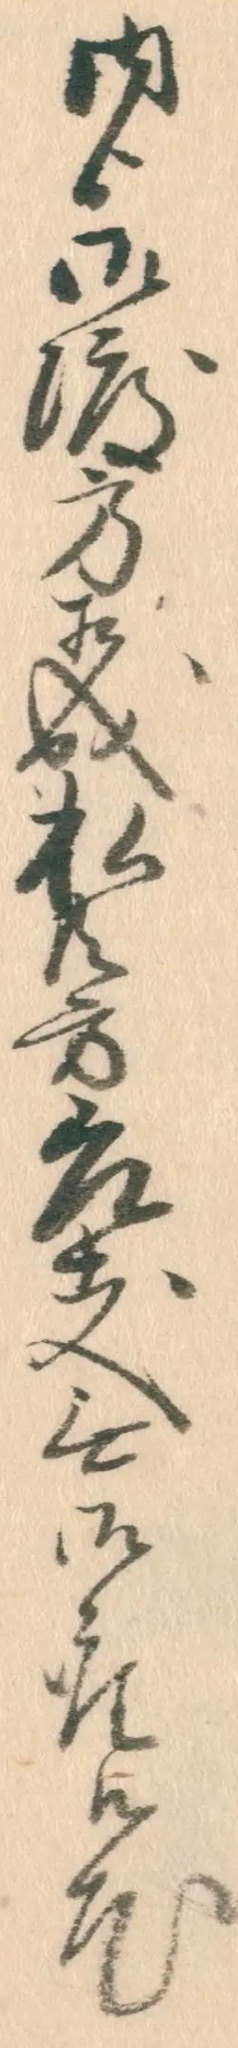内ゟ御渡方相成私共方差支無御座候尤
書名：三橋 17巻. [7] 三橋小破御修復書留　但御奉行御掛リ替地震潰橋番屋　嘉永四亥年より安政二卯年迄　上
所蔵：国立国会図書館 National Diet Library, JAPAN
